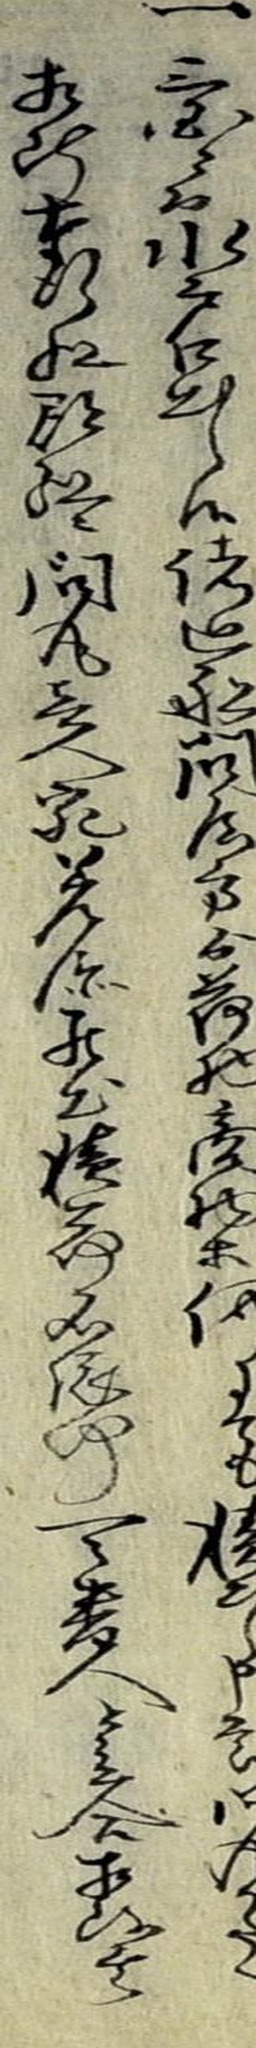相断奉行組郡組ニ問丸壱人宛差添罷出積荷不依何一々番人と立合相改其
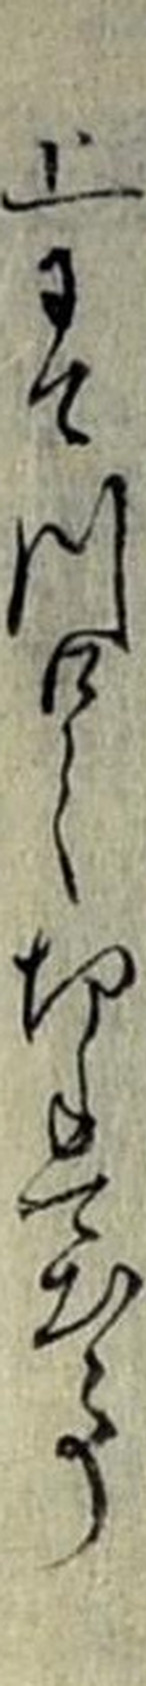上にて川口之切手可出事
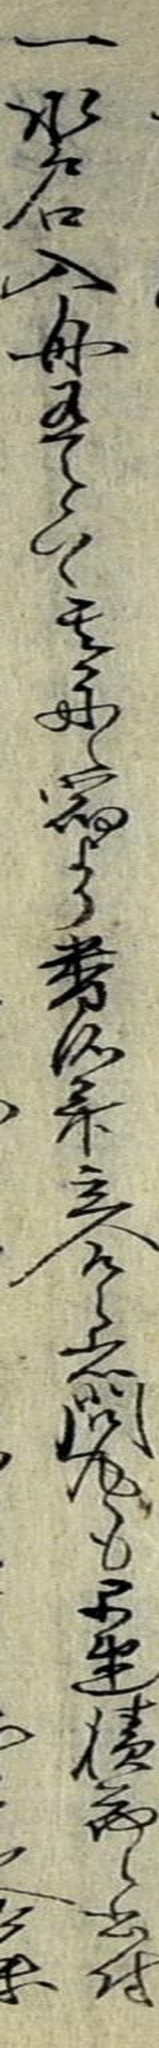一水戸口入舟有之候ハヽ其舟之宿より番所并立合之者問丸へも早速積荷之書付
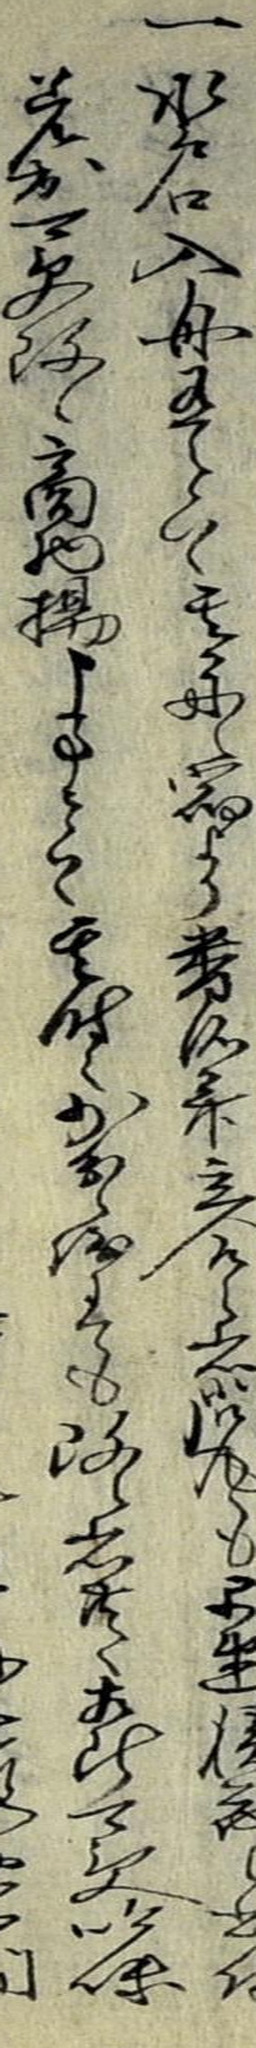差出可受改候商物揚申事ニ候ハヽ其時々少分之儀にても改候者共へ相断可受吟味
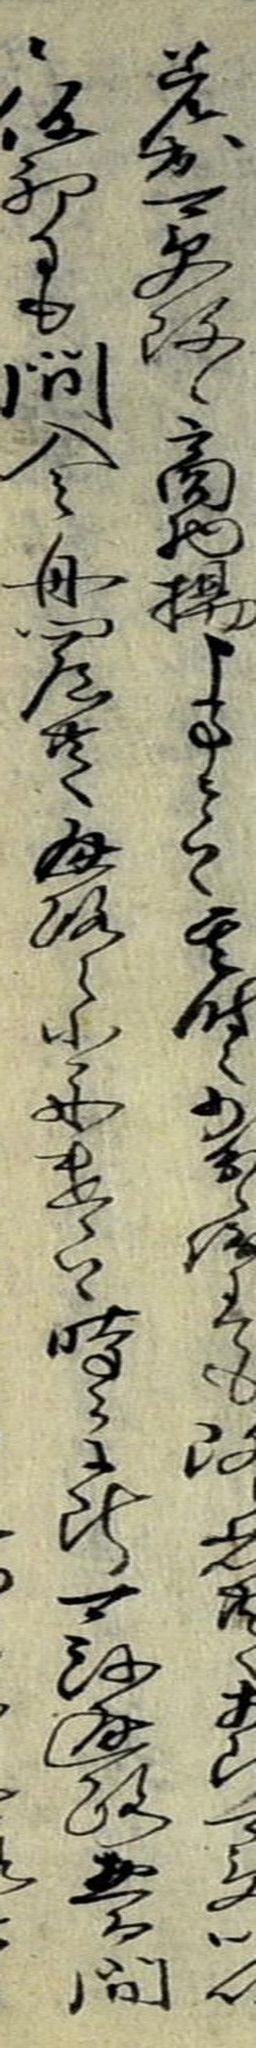候仮初にも問入之舟問屋共へ通路之小舟遣候ハヽ時々に断可致通路惣而問
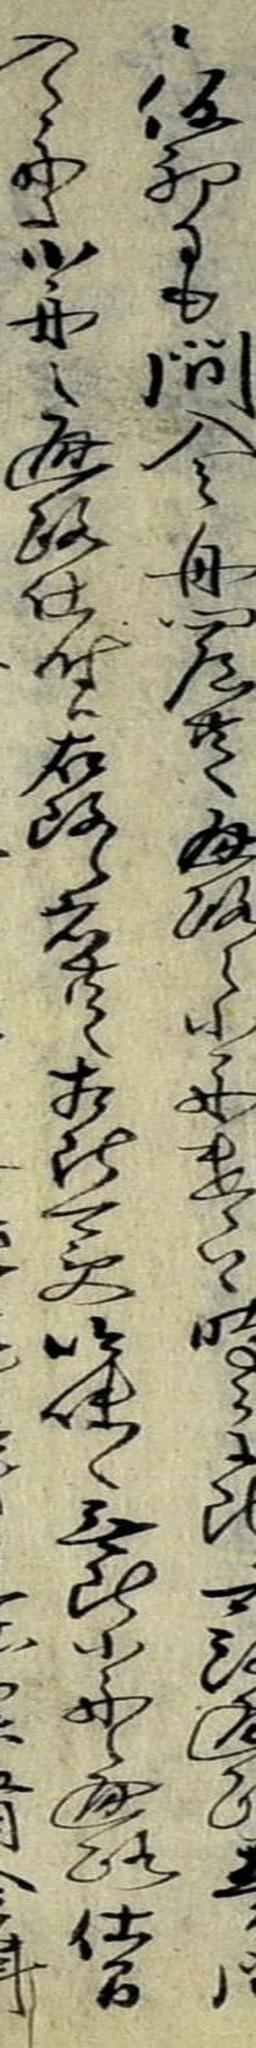入之舟に小舟之通路仕時ハ右改之者共へ相断可受吟味候無断小舟之通路仕間
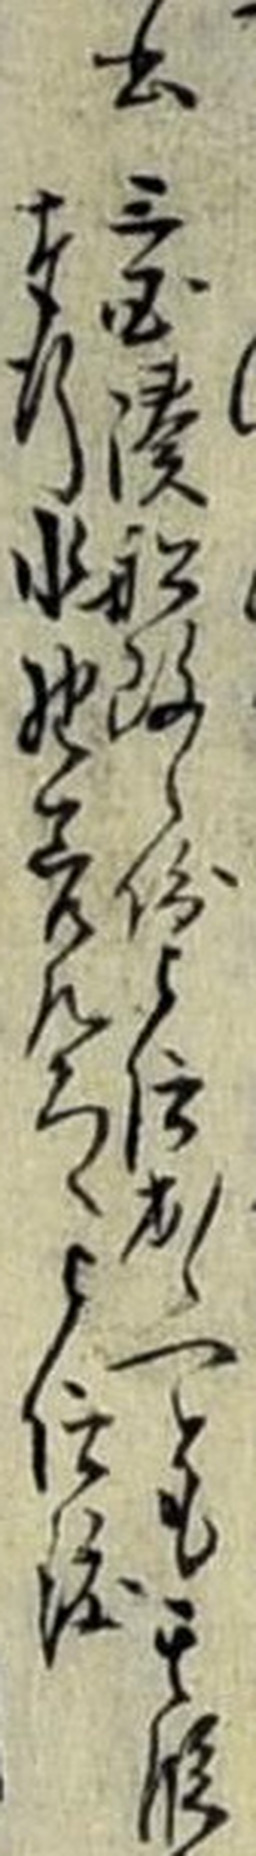奉行水野善左衛門へ被仰渡
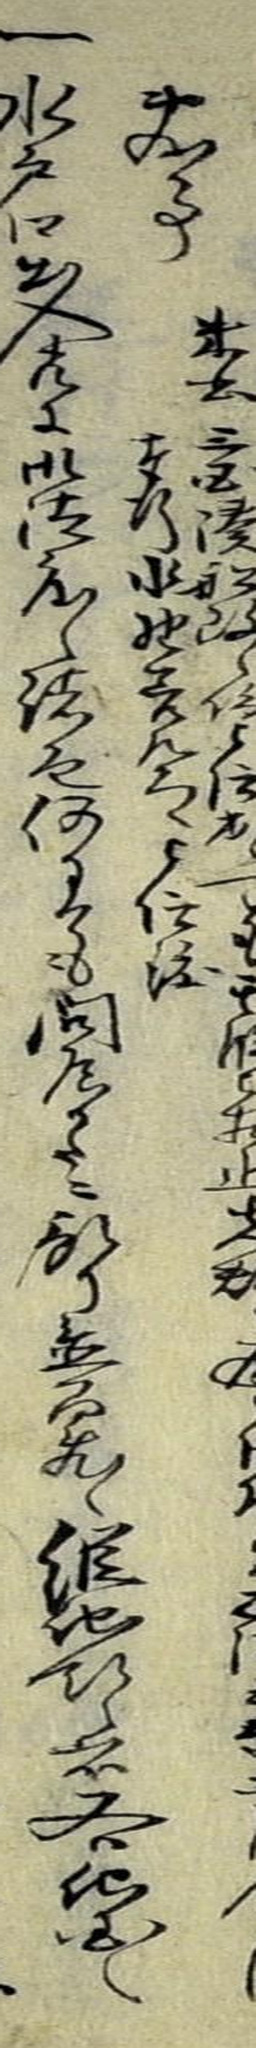一水戸口出入共に御法度之諸色何にても問屋かたニ預り置間敷候縦他領之者又ハ他国之
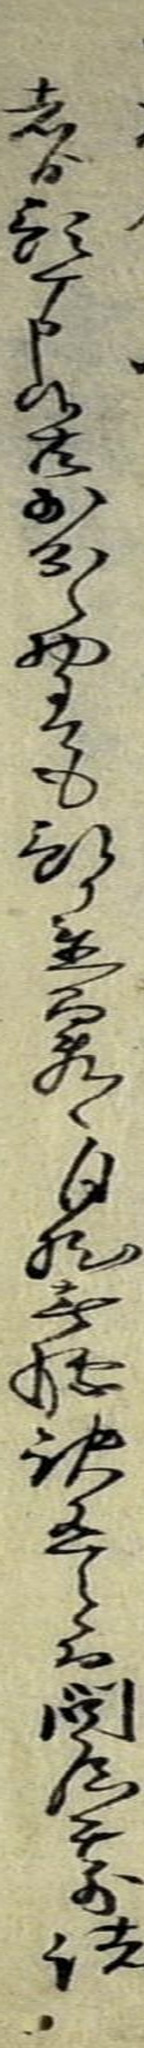者ゟ預ケ申候共少分之物にても預り置間敷候自然無拠訳有之候而問屋其外諸
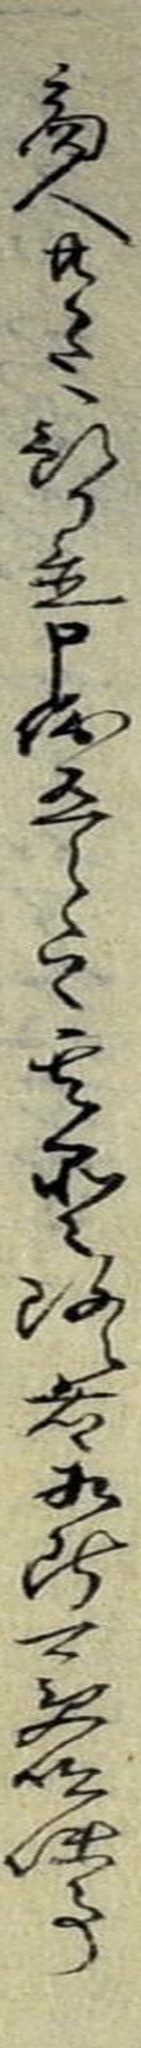商人共かたへ預り置申儀有之候ハヽ其品々改候者へ相断可受吟味事
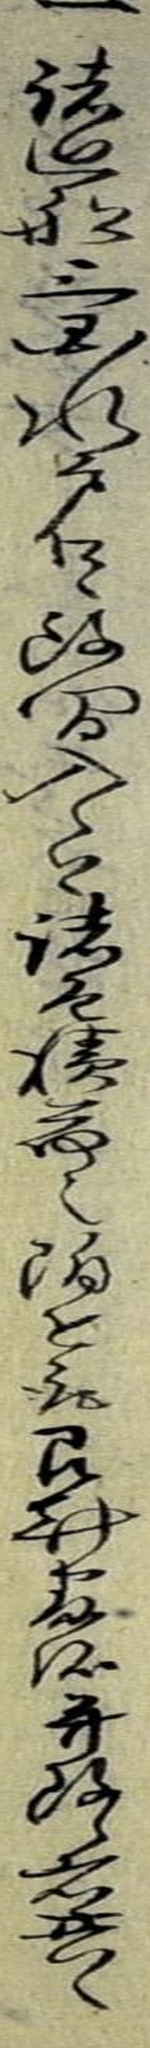一諸廻船三国水戸口へ致問入候ハヽ諸色積荷之附を取即刻番所并改之者共へ
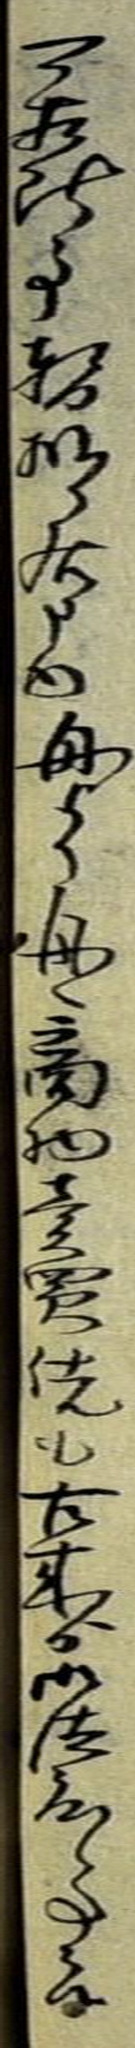可相断事暫掛り居申内舟より舟へ商物売買仕ルも古来ゟ御法度之事ニ候
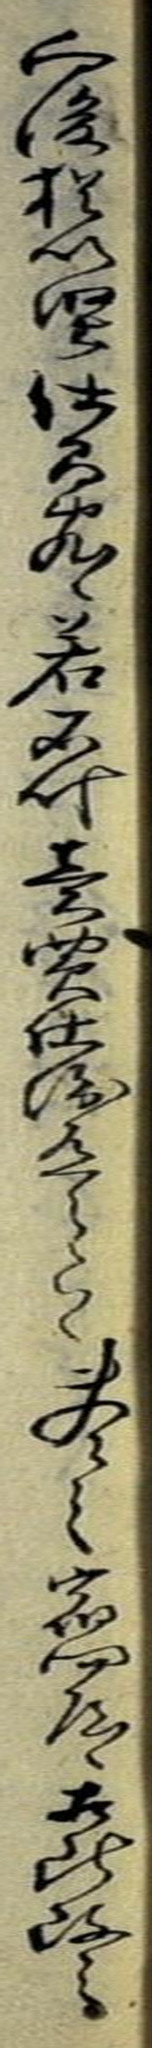向後猶以堅仕間敷候若不叶売買仕儀有之候ハヽ夫々之宿問屋へ相断改之
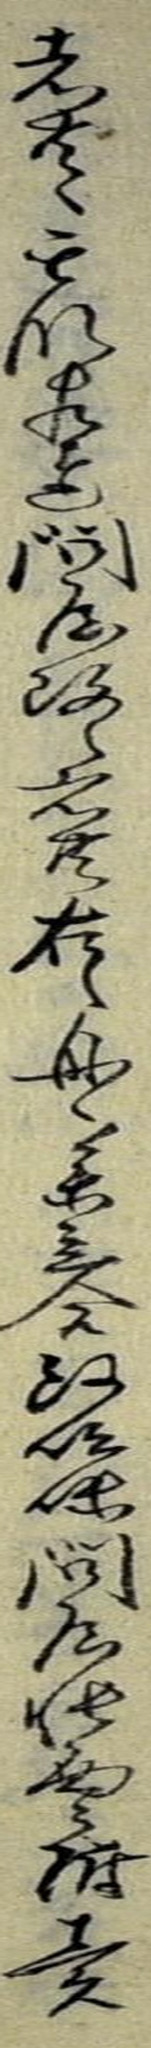者共へ其段相達問屋改之者共右之舟へ参立合致吟味問屋帳面ニ附売
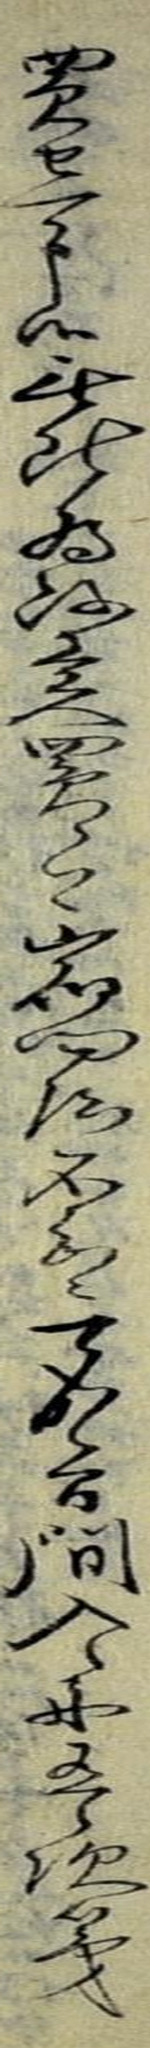買セ可申候無断為致売買候ハヽ宿問屋不念ニ可成候間問入之舟有之次第
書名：命令之部 一
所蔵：福井県文書館 Fukui Prefectural Archives
